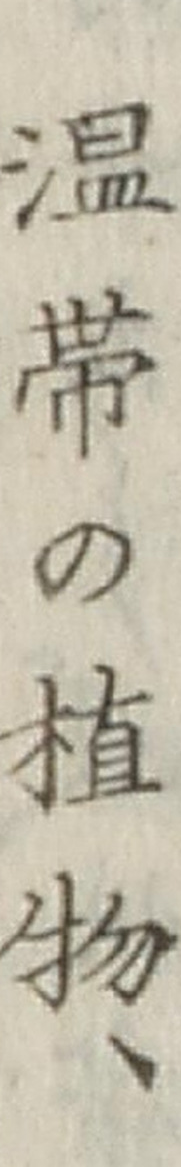温帯の植物、
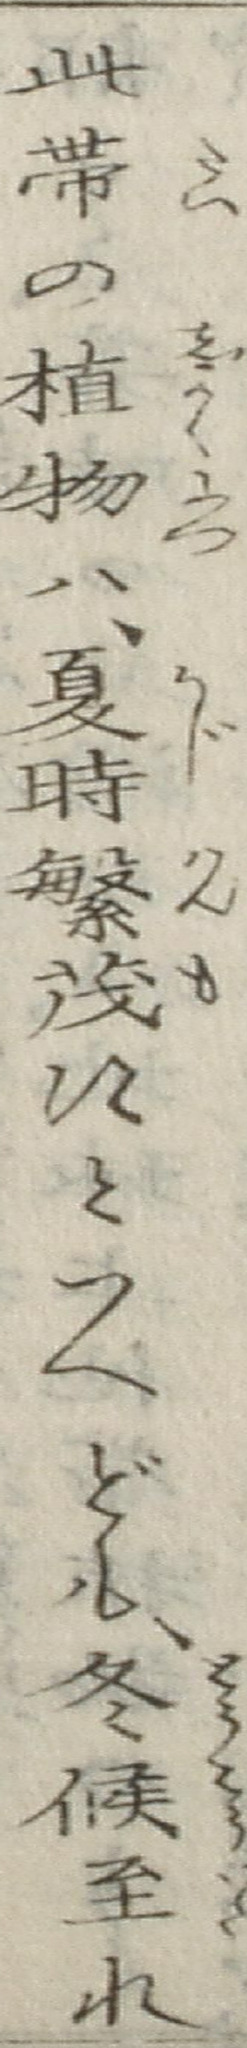此帯の植物は、夏時繁茂すといへども、冬候至れ
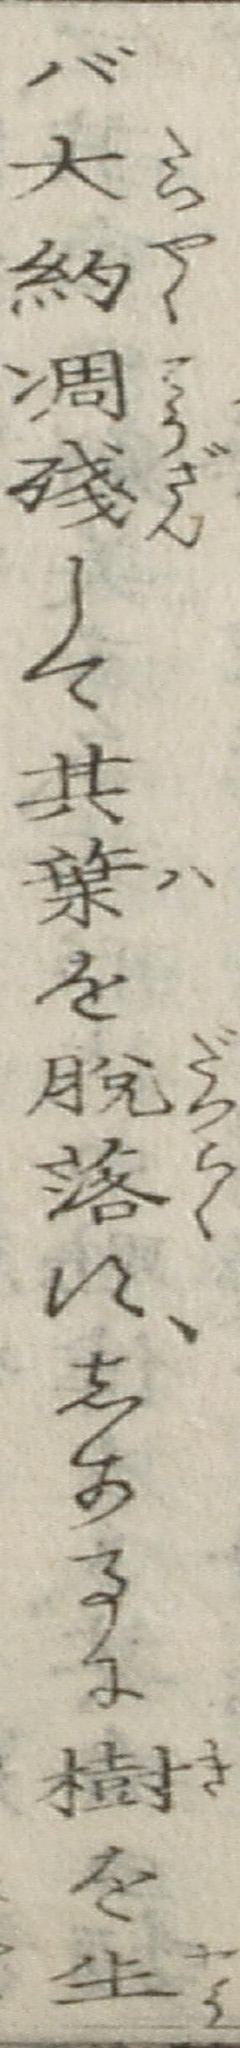ば大約凋残して其葉を脱落す、しかるに樹を生
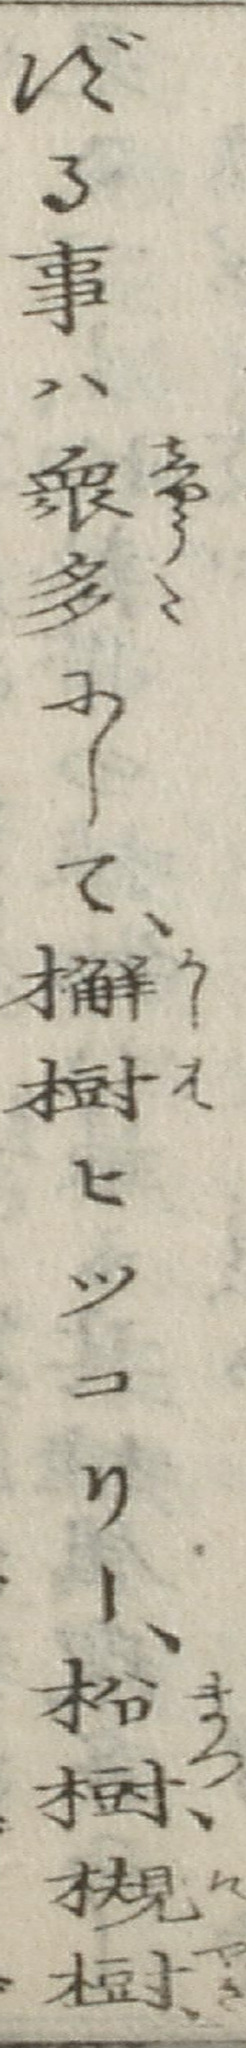ずる事は衆多にして、槲樹ヒツコリー、松樹、槻樹、
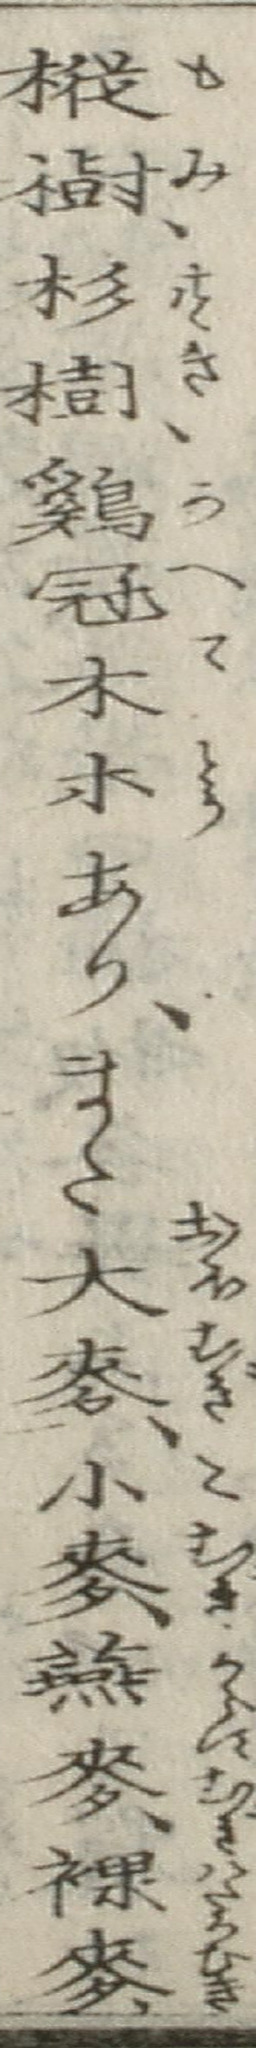樅樹、杉樹、鷄冠木等あり、また大麦、小麦、燕麦、裸麦、
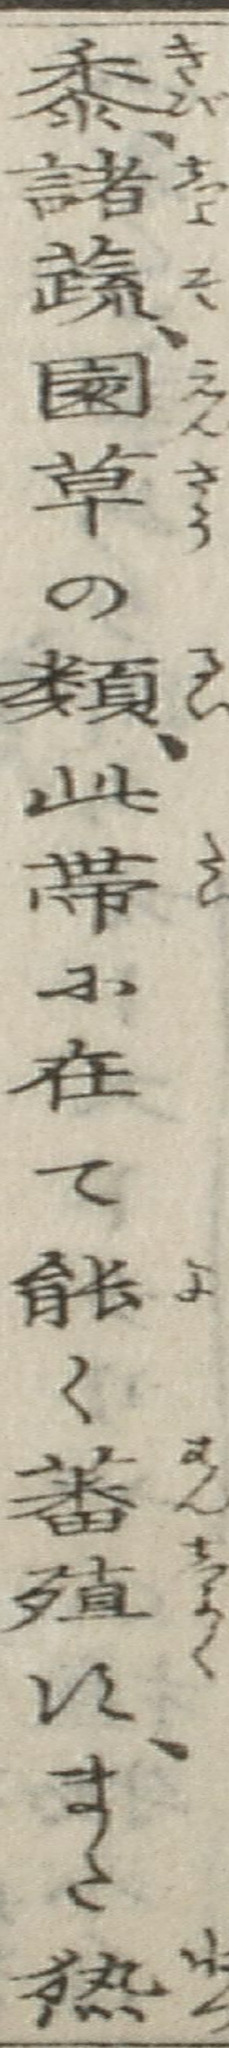黍、諸蔬、園草の類、此帯に在て能く蕃殖す、また熱
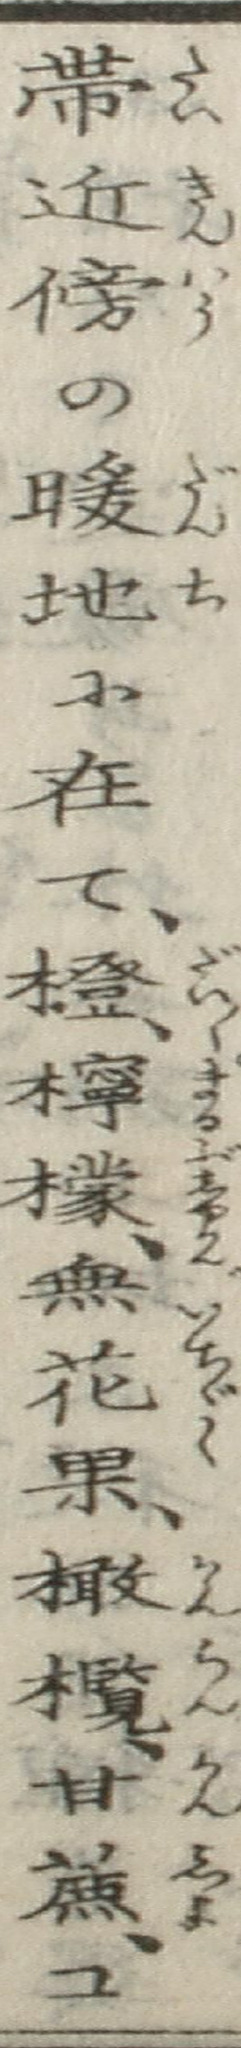帯近傍の暖地に在て、橙、檸檬、無花果、橄欖、甘蔗、ユ
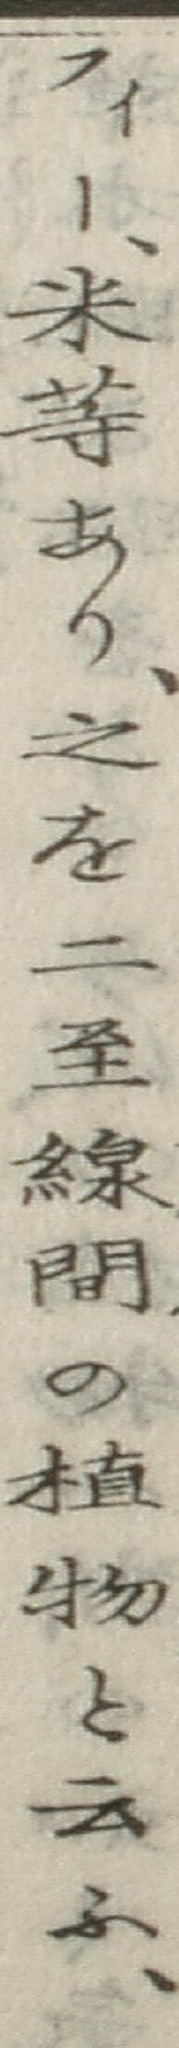フィー、米等あり、之を二至線間の植物と云ふ、
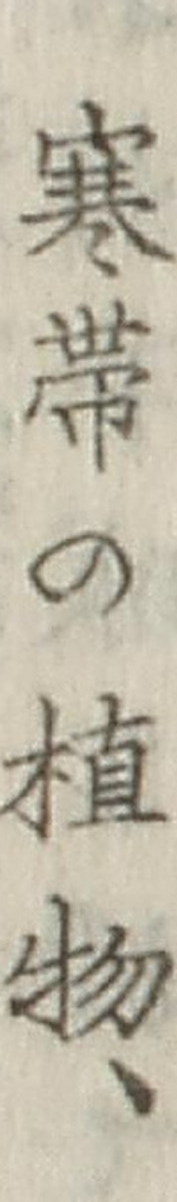寒帯の植物、
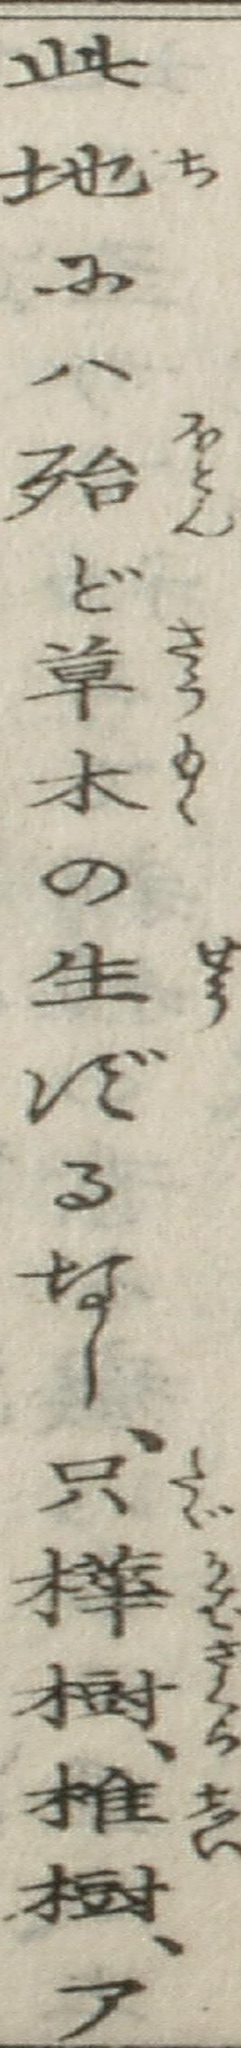此地には殆ど草木の生ずるなし、只樺樹、椎樹、ア
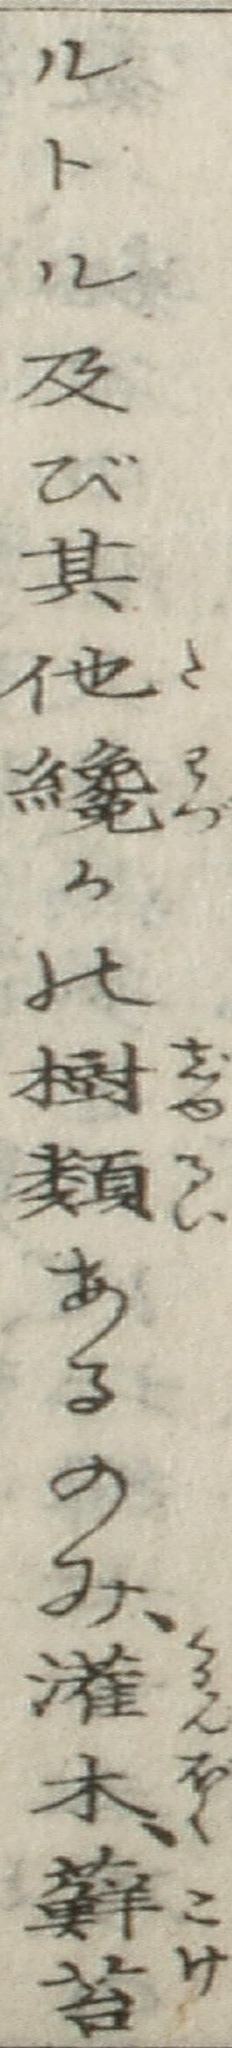ルトル及び其他僅かの樹類あるのみ、灌木、蘚苔
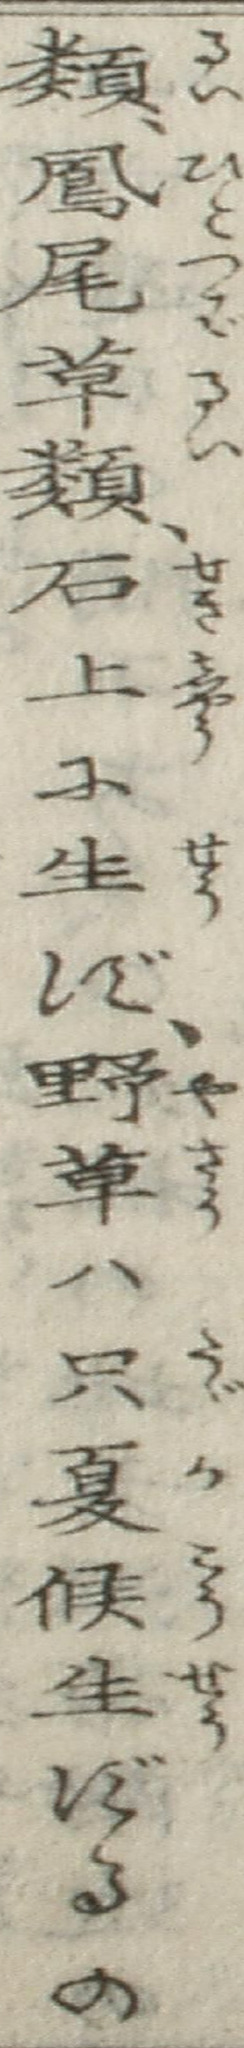類、鳳尾草類、石上に生ず、野草は只夏候生ずるの
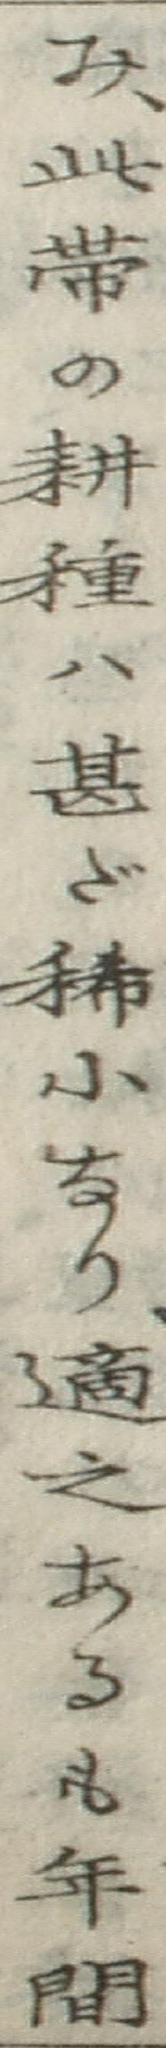み、此帯の耕種は甚だ稀少なり、適之あるも年間
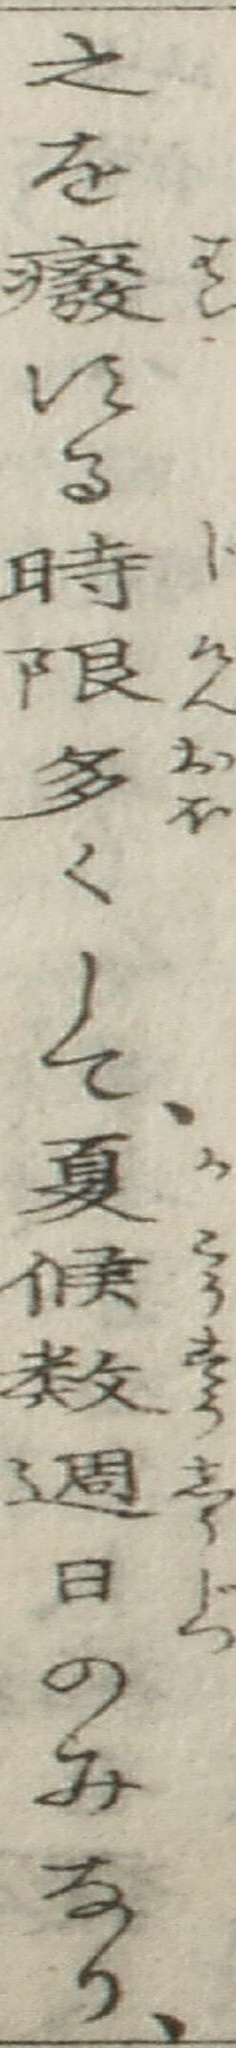之を廃する時限多くして、夏候数週日のみなり、

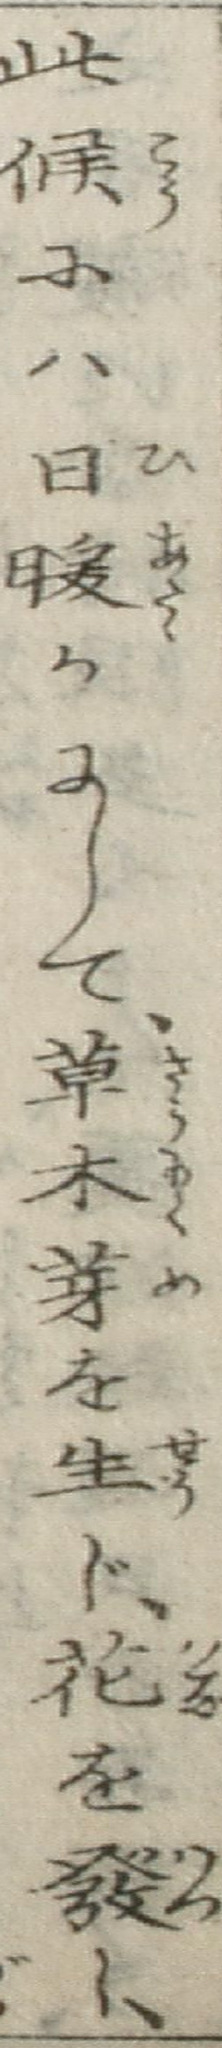此候には日暖かにして、草木芽を生じ、花を発し、
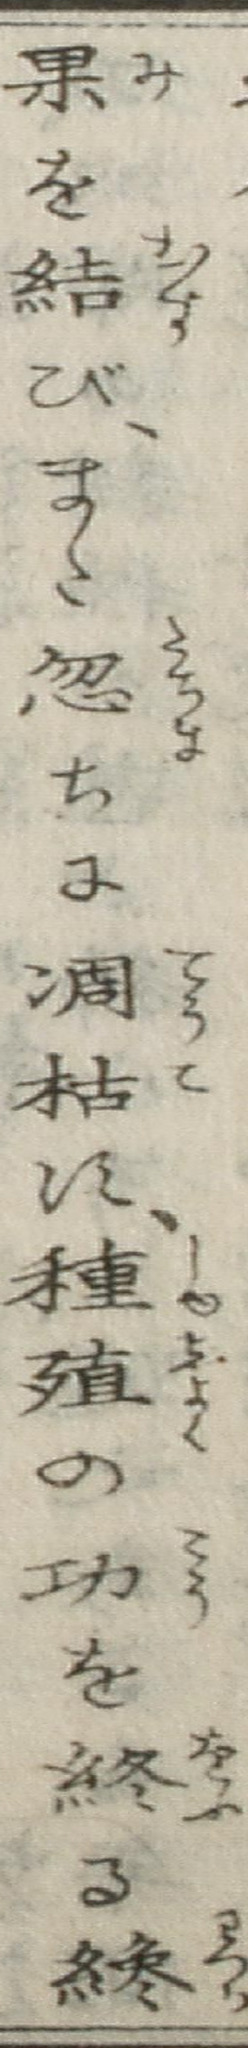果を結び、また忽ちに凋枯す、種殖の功を終る僅
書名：訓蒙　天然地理學　下
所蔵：東京大学地震研究所図書室 Earthquake Research Institute Library, The University of Tokyo, JAPAN
